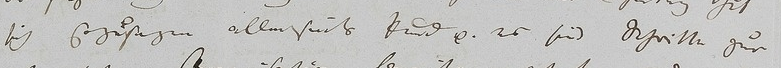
sich sozusagen allerseits kund &. es sind Schritte zur
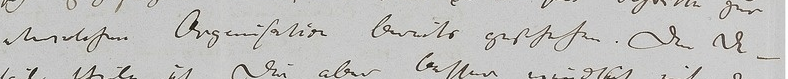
etwelchen Organisation bereits geschehen. Den De-
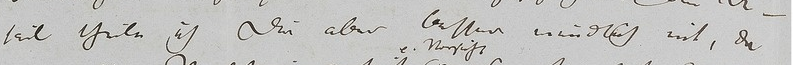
tail theile ich Dir aber besser mündlich mit, da
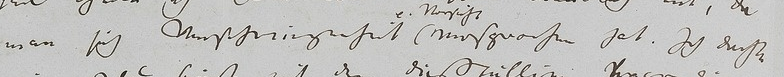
man sich Verschwiegenheit &. Vorsicht versprochen hat. Ich dachte
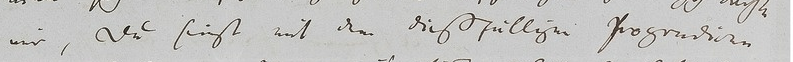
mir, Du seiest mit dem dießfälligen Progrediren
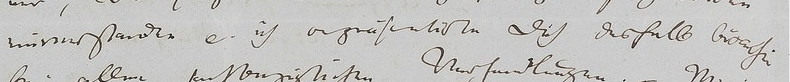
einverstanden &. ich repräsentirte Dich deshalb bis anhin
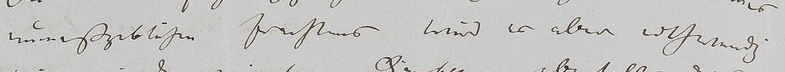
unmaßgeblichen Erachtens wird es aber nothwendig
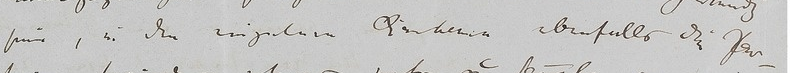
sein, in den einzelnen Kantonen ebenfalls die Par-
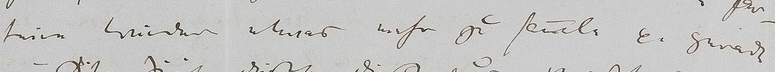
teien wieder etwas mehr zu sammeln &. gerade
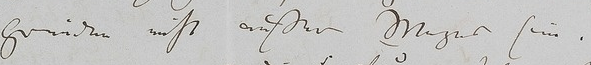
Gründen nicht außer Weges sein.
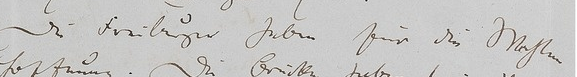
Die Freiburger haben für die Wahlen
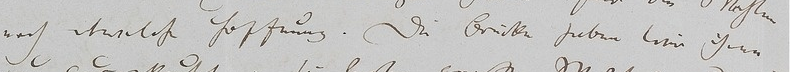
noch etwelche Hoffnung. Die Brücke haben wir ihnen
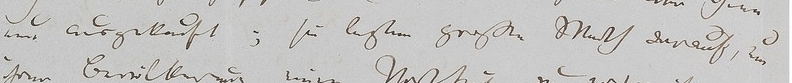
nun ausgekauft; sie legten großen Werth darauf, um
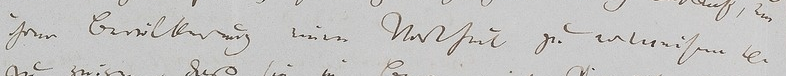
ihrer Bevölkerung einen Vortheil zu erweisen &.
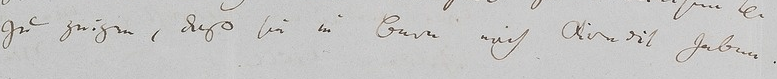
zu zeigen, daß sie in Bern noch Kredit haben.
